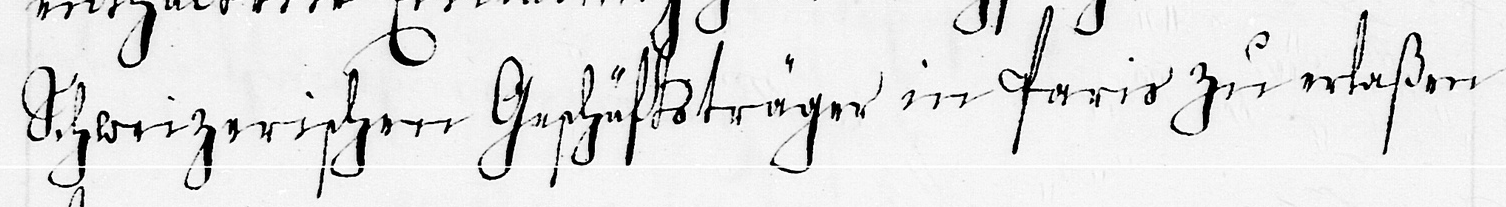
Schweizerischen Geschäftsträger in Paris zu erlaßen
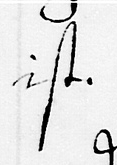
ist.
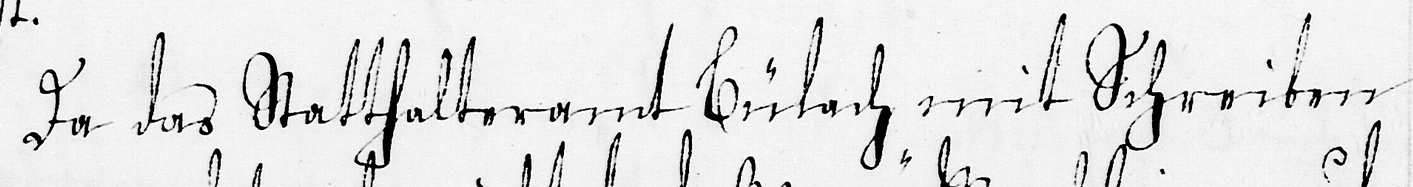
Da das Statthalteramt Bülach mit Schreiben
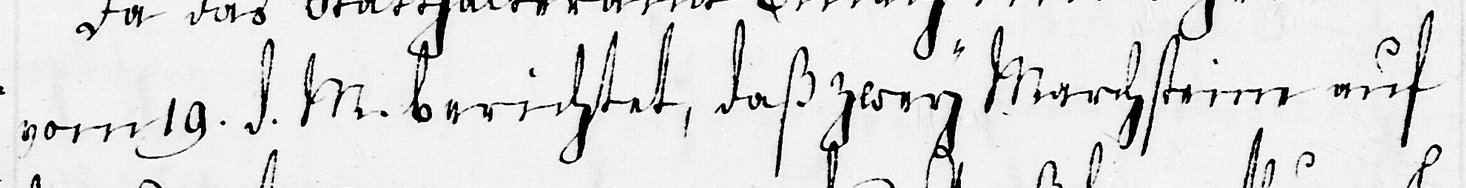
vom 19. d. M. berichtet, daß zwey Marchsteine auf
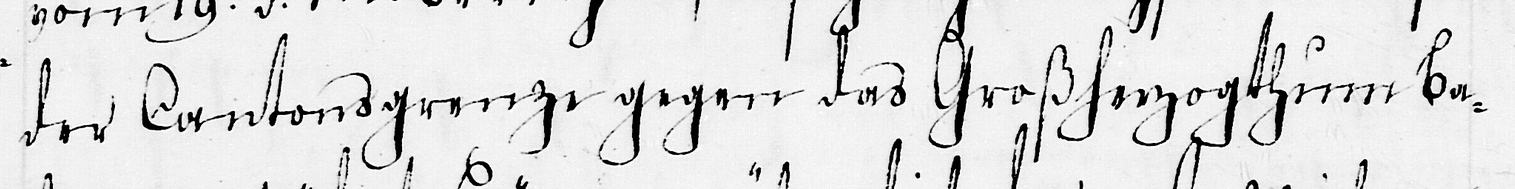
der Cantonsgrenze gegen das Großherzogthum Ba¬
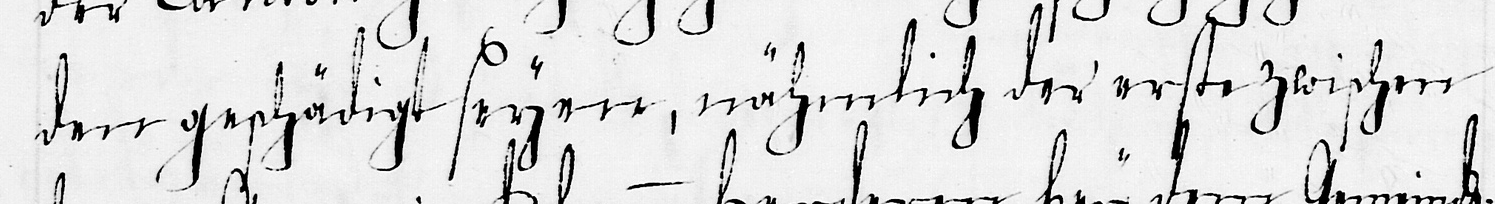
den geschädigt seyen, nähmlich der erste zwischen
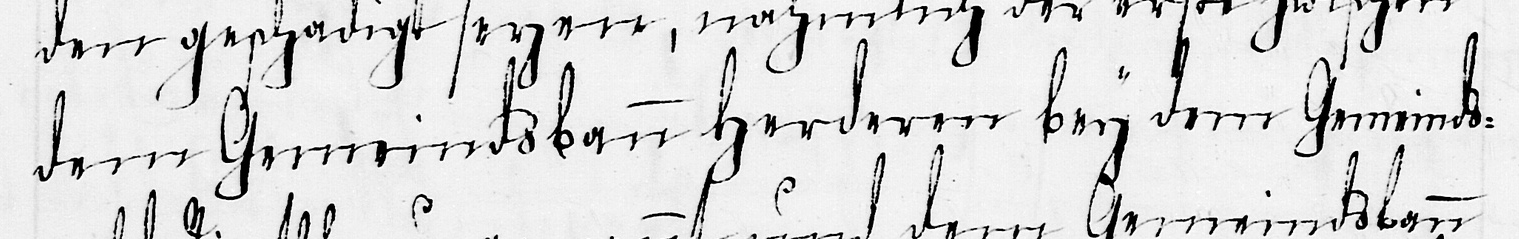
dem Gemeindsbann Herderen bey dem Gemeinds¬
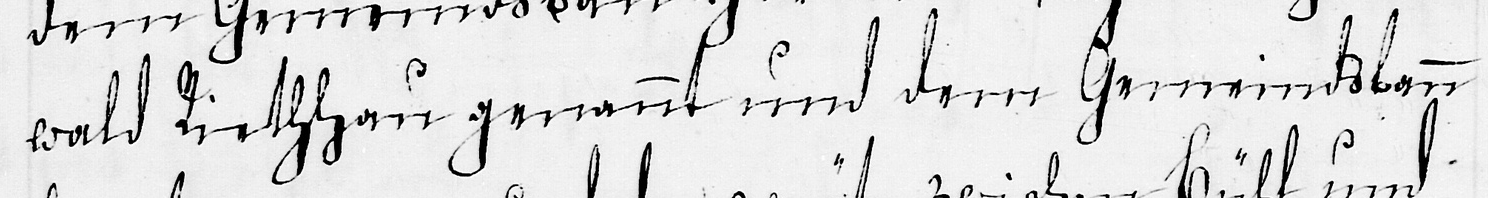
wald Riethhau genannt und dem Gemeindsbann
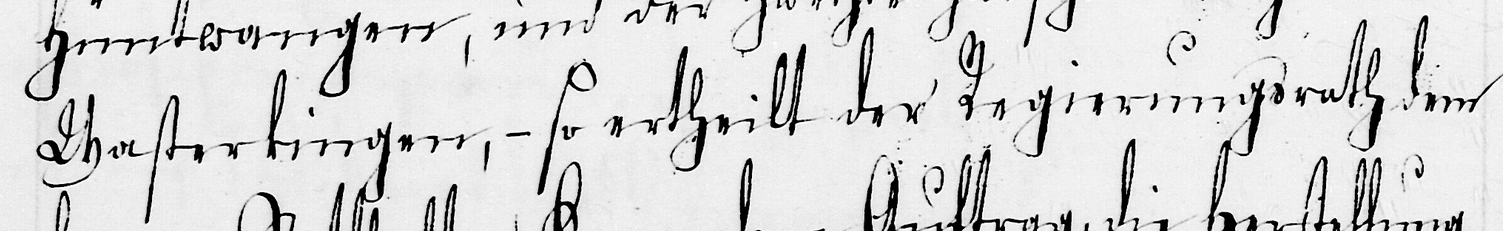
Wasterkingen, – so ertheilt der Regierungsrath dem
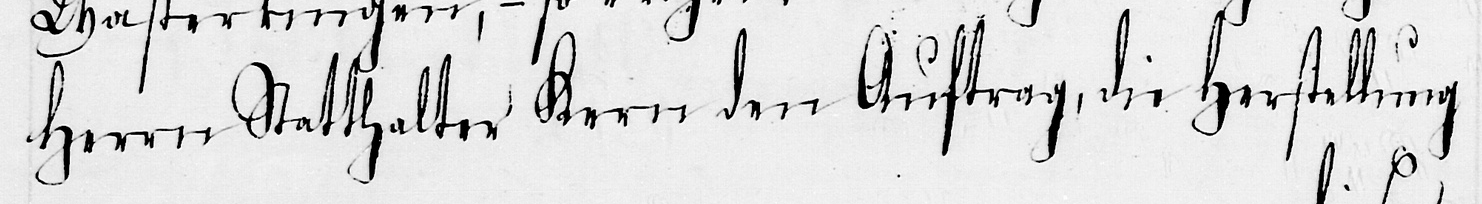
Herrn Statthalter Kern den Auftrag, die Herstellung
